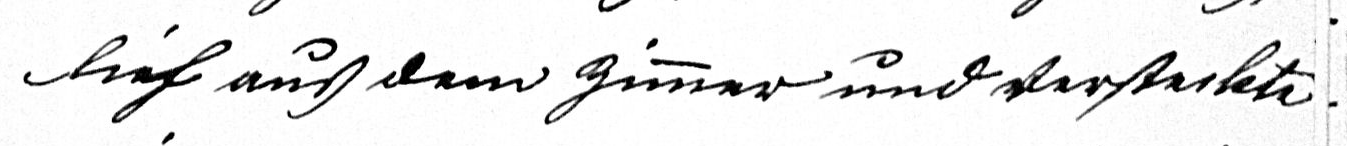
lief aus dem Zimmer und versteckte
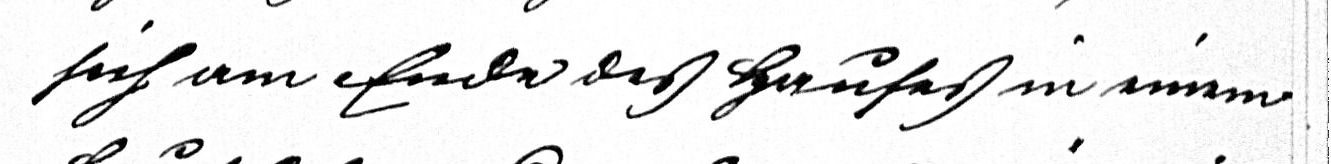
sich am Ende des Hauses in einem
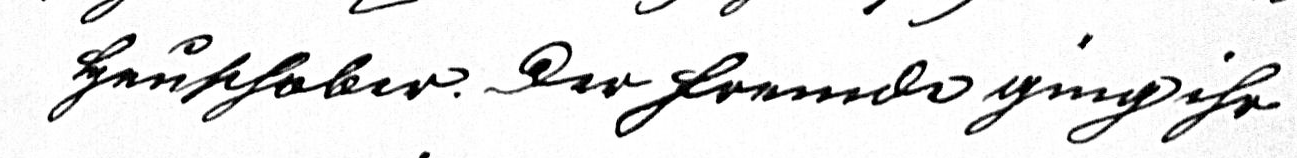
Heuschober. Der fremde ging ihr
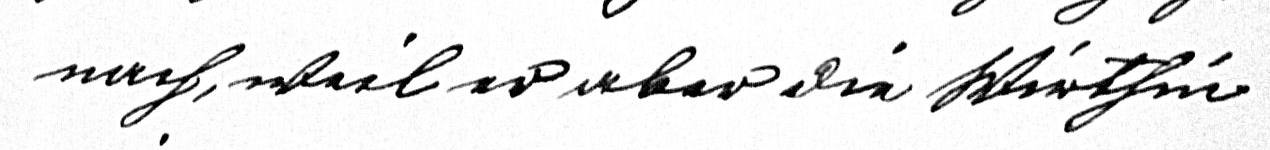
nach, weil er aber die Wirthin
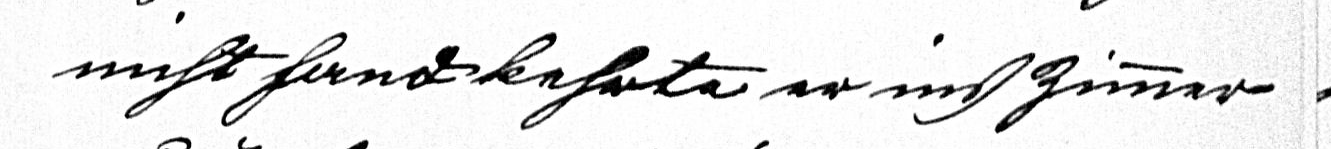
nicht hand kehrte er ins Zimmer
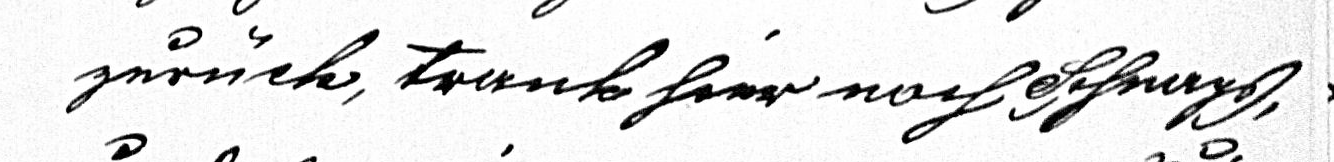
zurück, trank hier noch Schnaps,
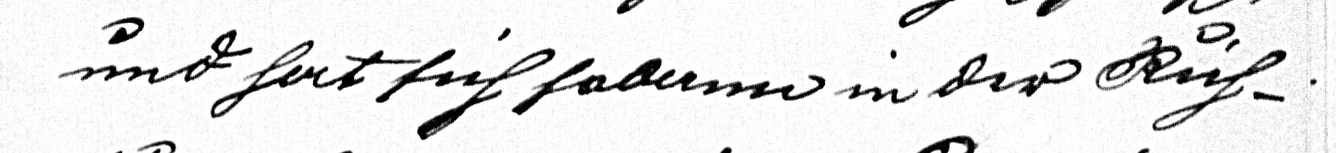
und hat sich sodann in der Rich¬
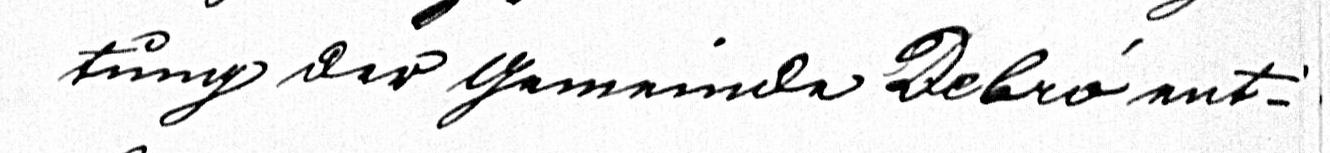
tung der Gemeinde Debró ent¬
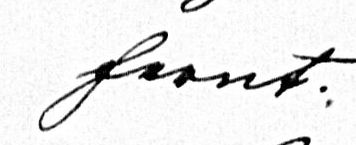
fernt.
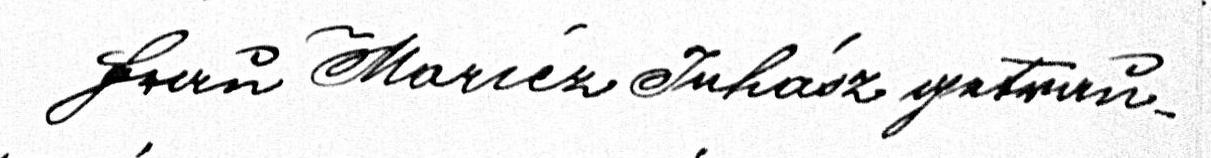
Frau Maricz Juhász getrau¬
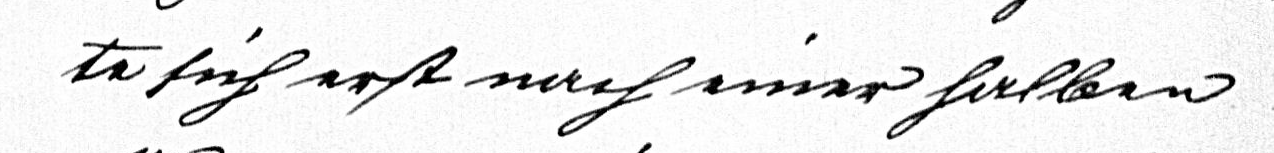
te sich erst nach einer halben
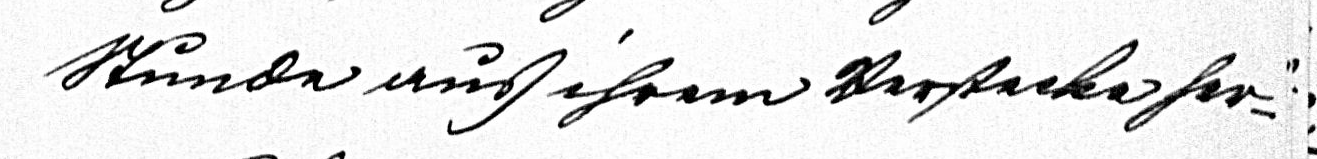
Stunde aus ihrem Verstecke her¬
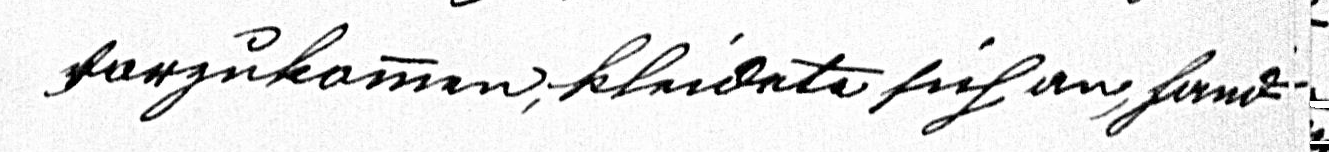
vorzukommen, kleidete sich an, hand¬
